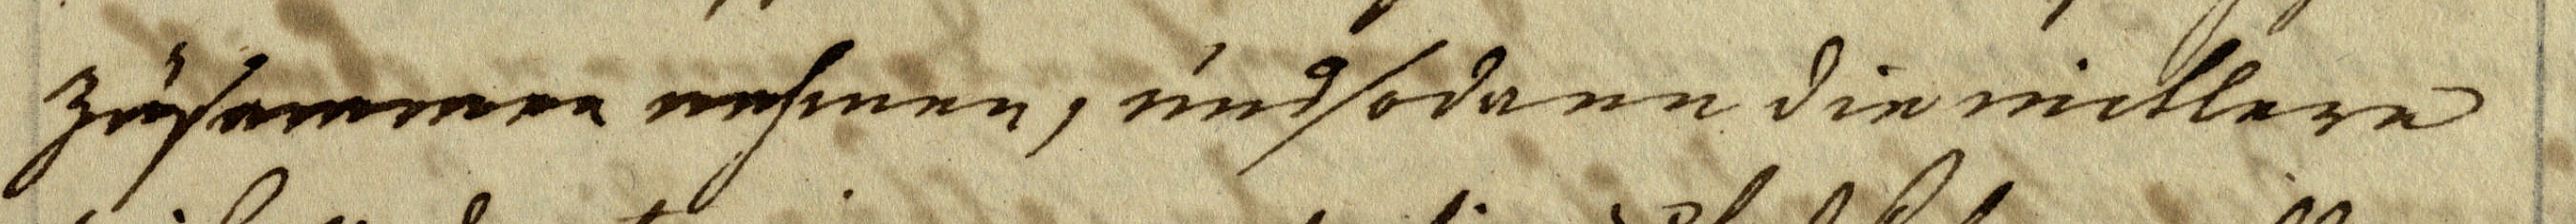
zusammen nehmen, und sodann die mittlere
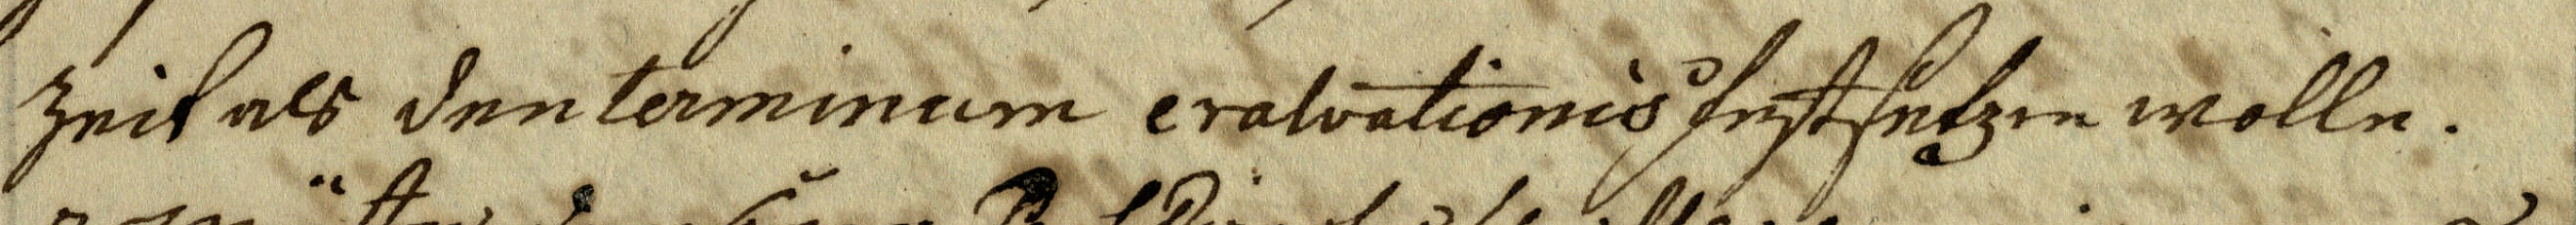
Zeit als den terminum eratrationis festsetzen wolle.
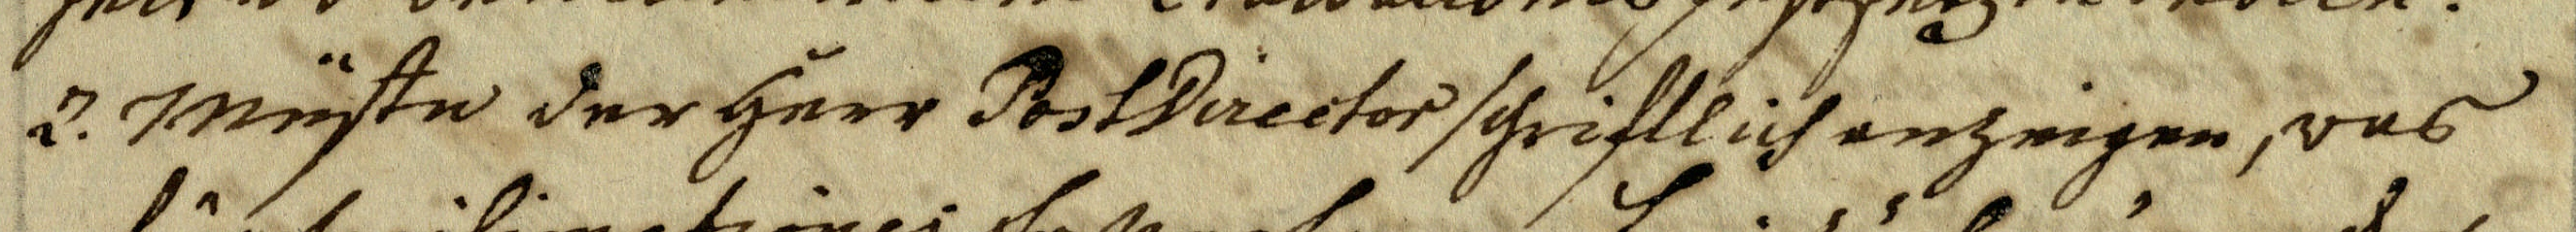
2. Müßte der Herr PostDirector schriftlich anzeigen, was
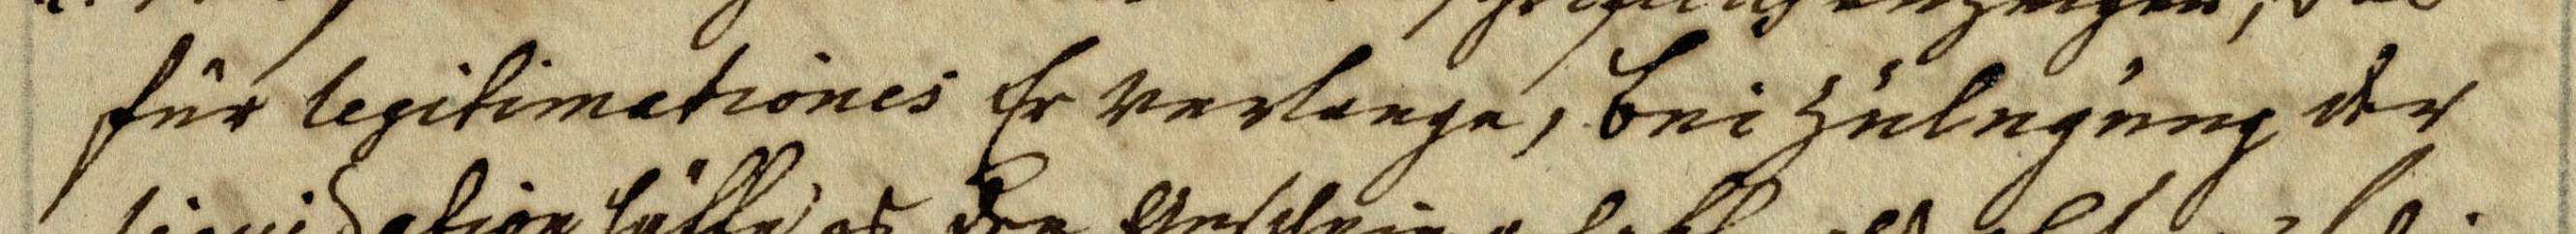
für legitimationes Er verlange, bei Zulegung der
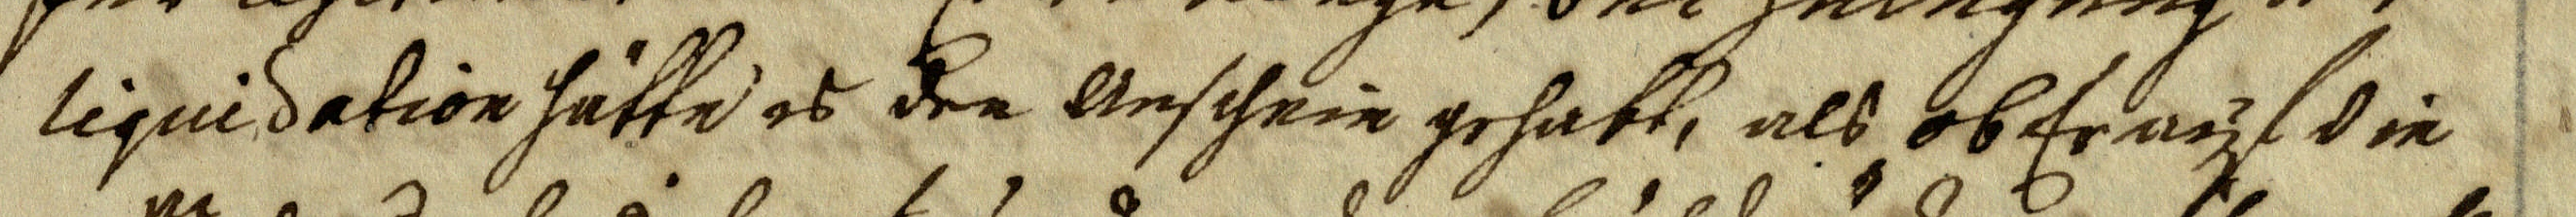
liquidation hätte es den Anschein gehabt, als ob Er auf die
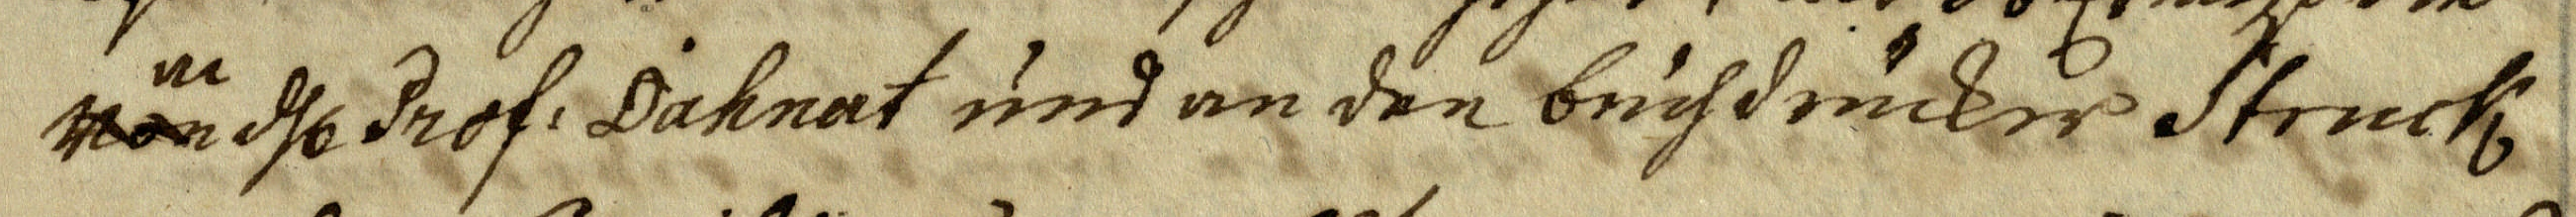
an dh Prof. Dähnert und an den Buchdrucker Struck
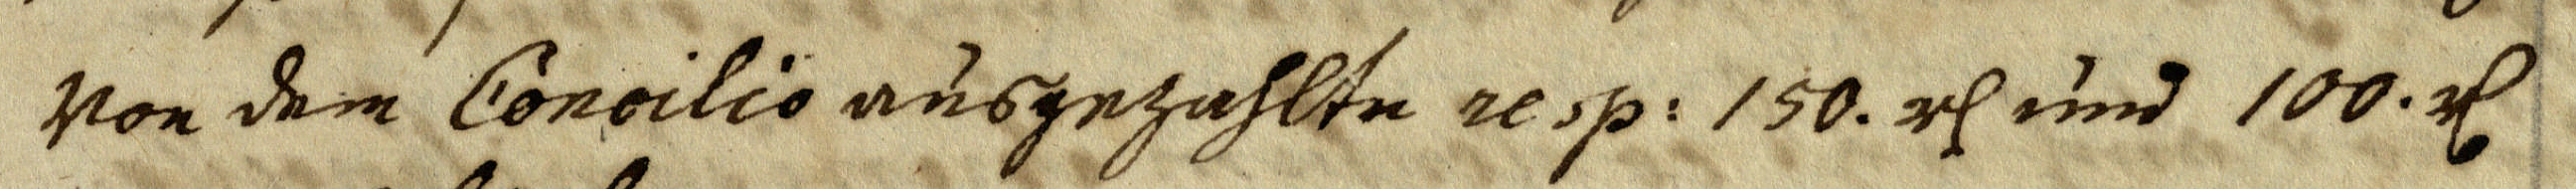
von dem Concilio ausgezahlte resp. 150 rt und 100 rt
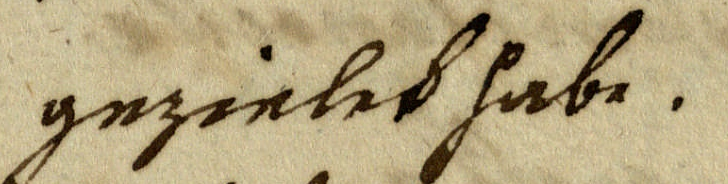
gezielet habe.
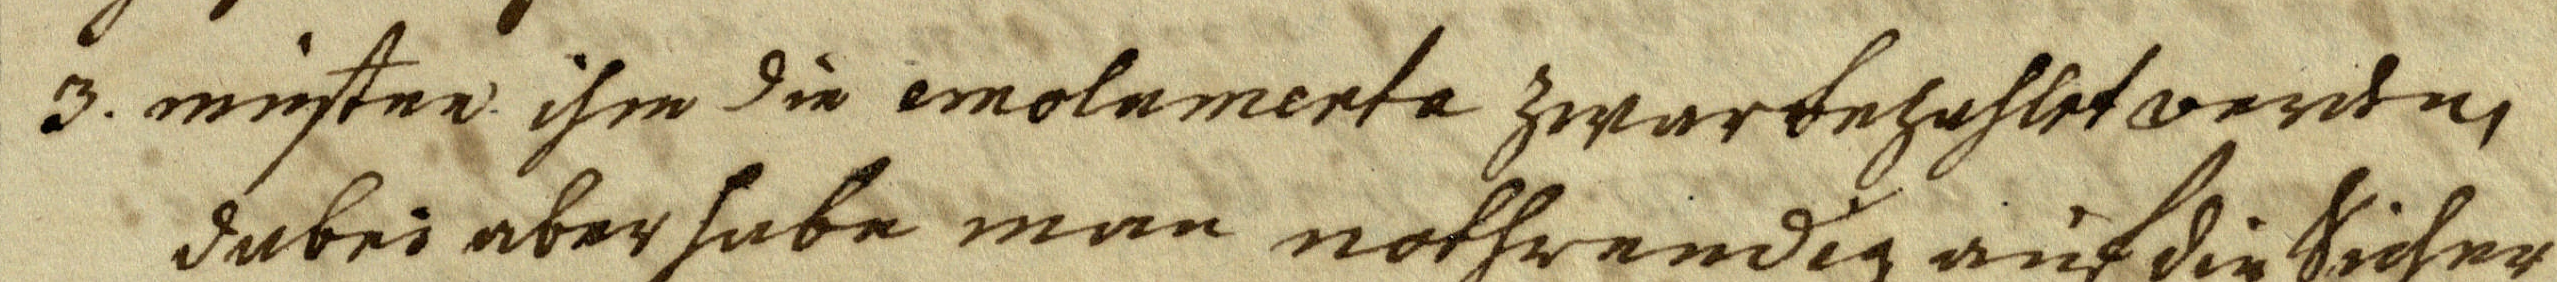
3. müßten ihm die emolumente zwar bezahlet werden,
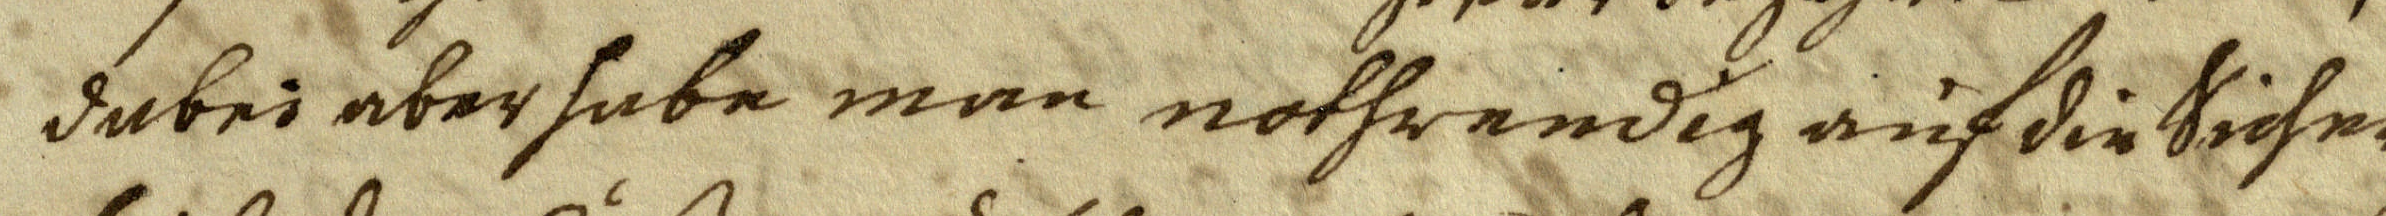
dabei aber habe man nothwendig auf die Sicher¬
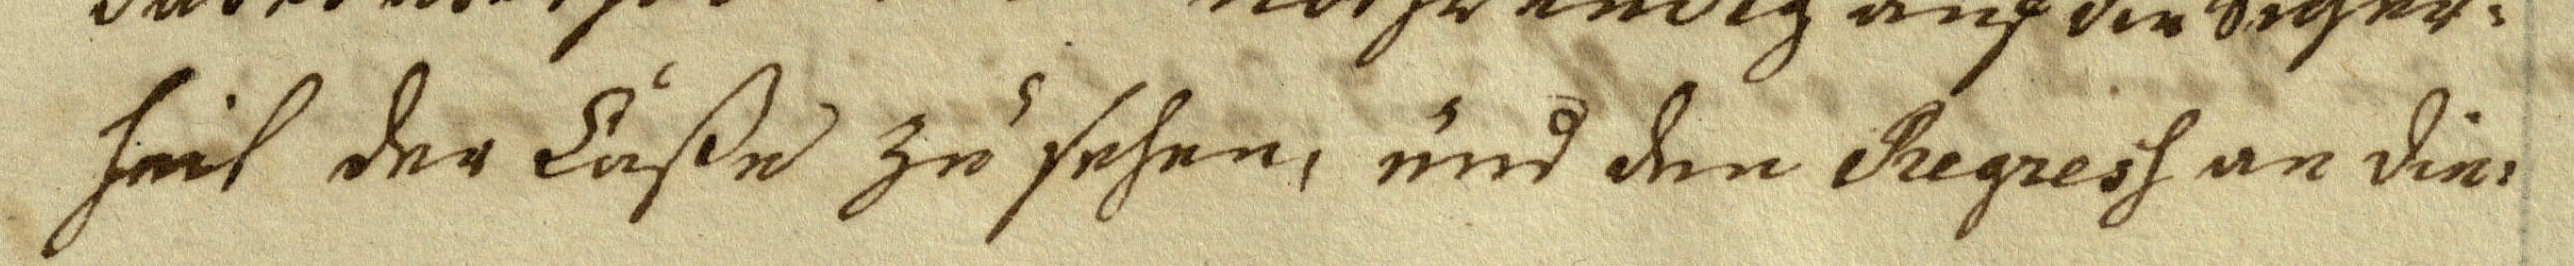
heit der Caße zu sehen, und dem Regress an die¬
